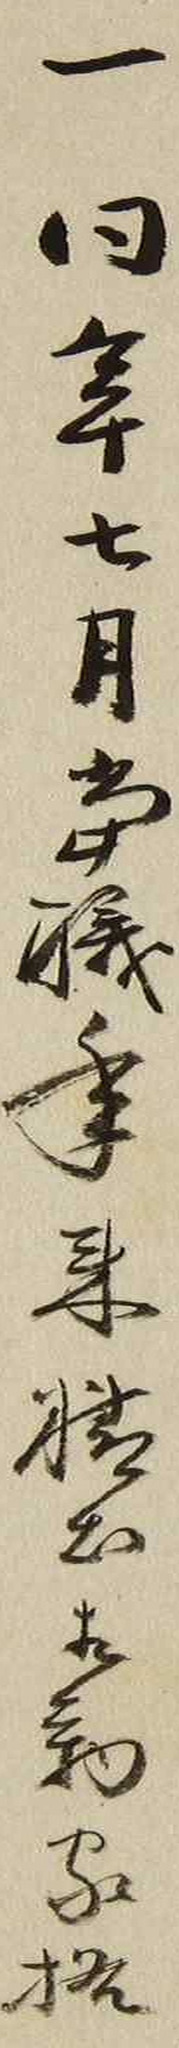一同年七月当職年来精出相勤家格
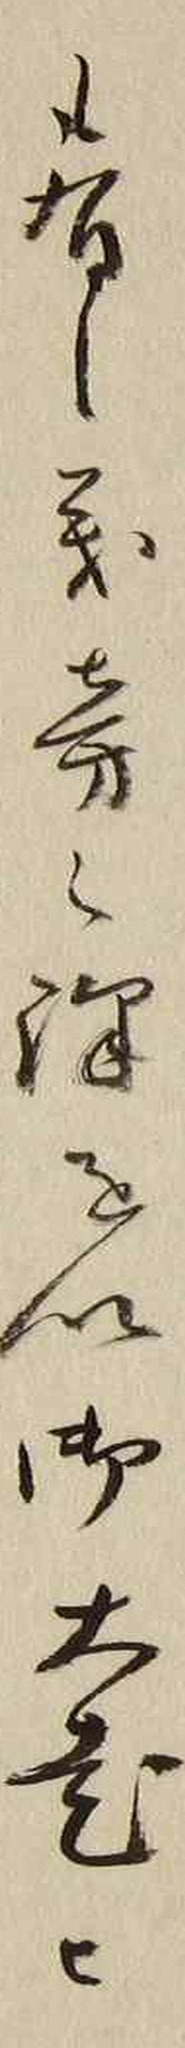も有之義旁之譯を以御大老被
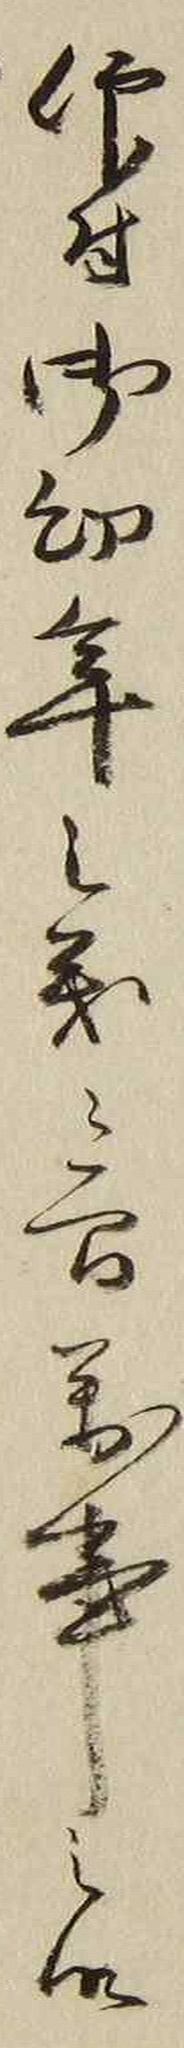仰付御幼年之義に候間万事之御
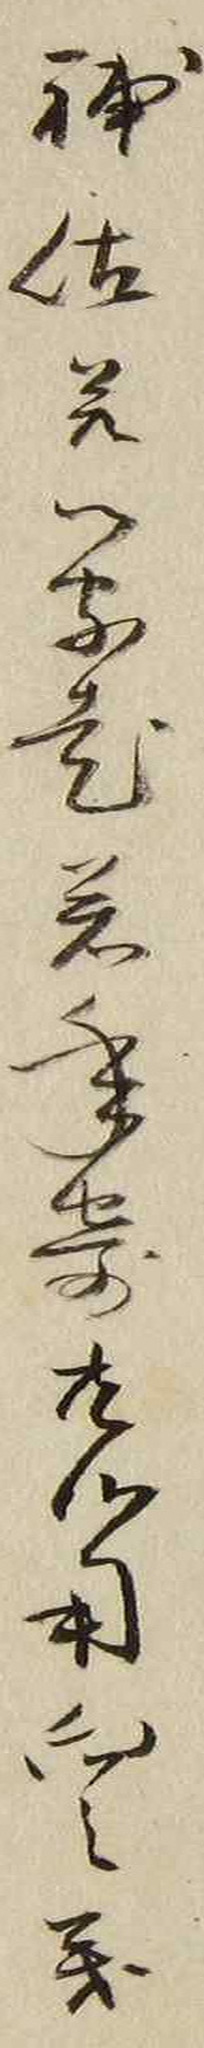補佐并御家老若年寄共御用向之義

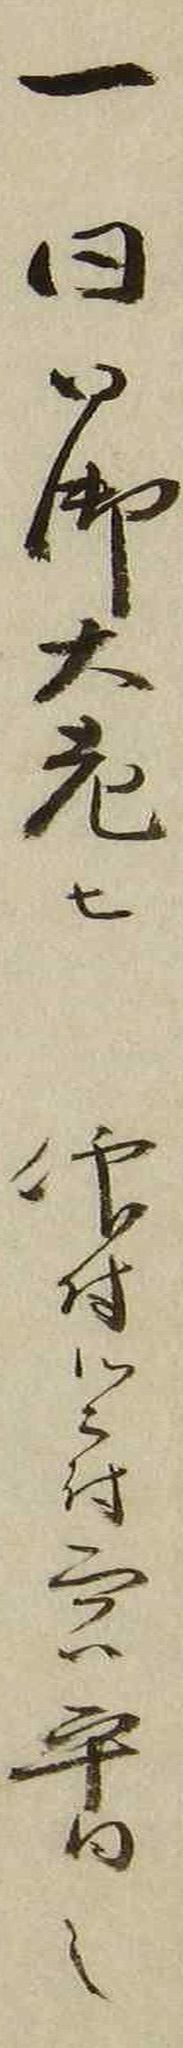一同日御大老被仰付候に付而は平日之
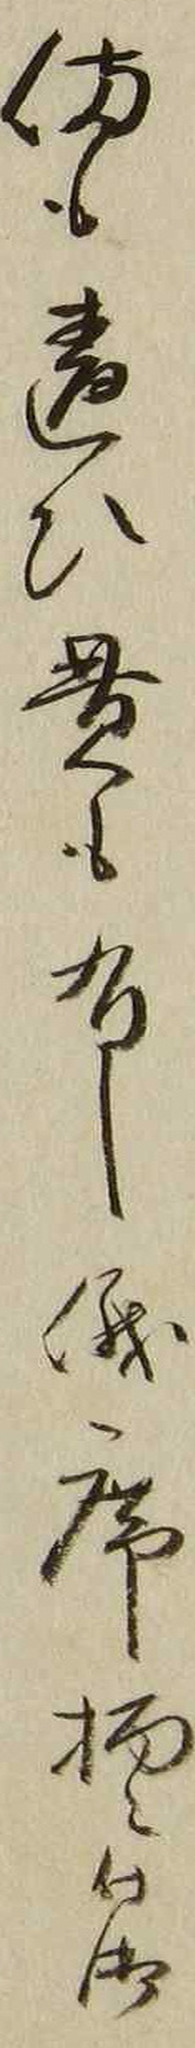備も違ひ費も有之儀席柄に付御
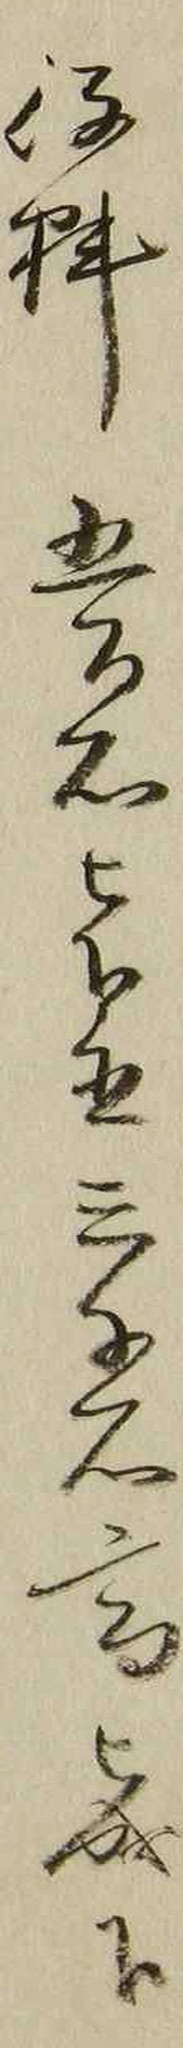役料五百石被下置三千石高被成下
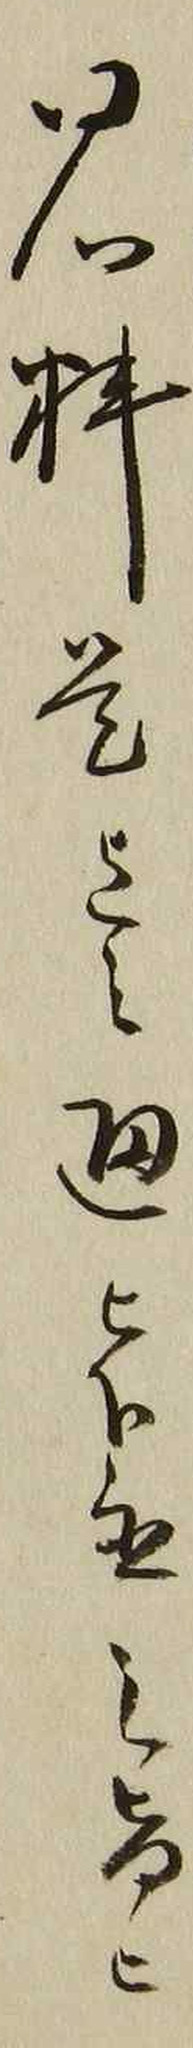同心料是迄之通被下置之旨被
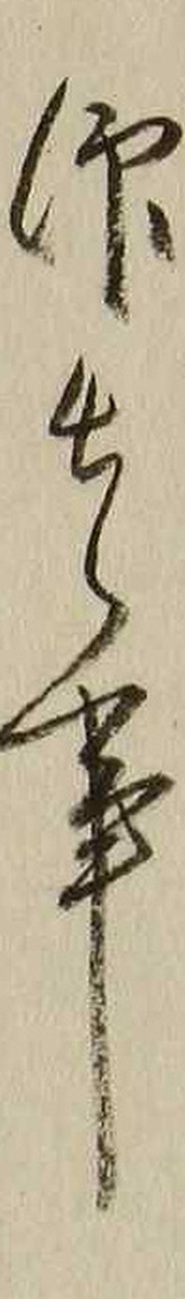仰出候事
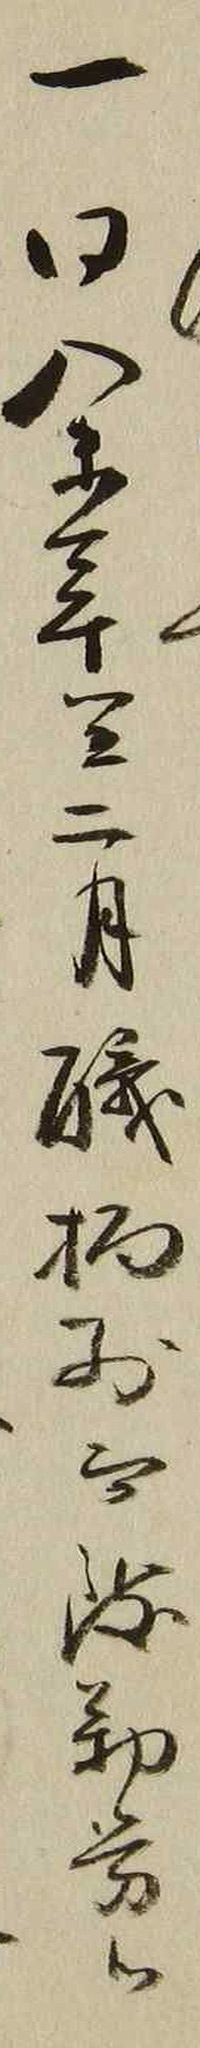一同八未年閏二月職柄別而致勤労候
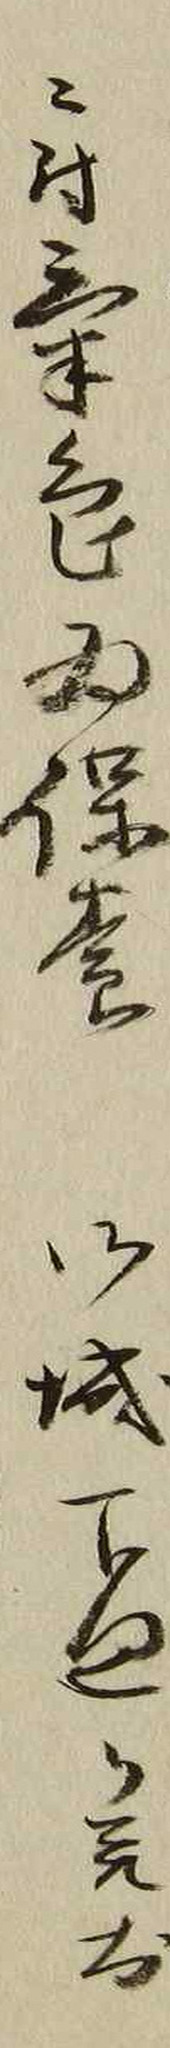に付気色為保養御城下廻り并前
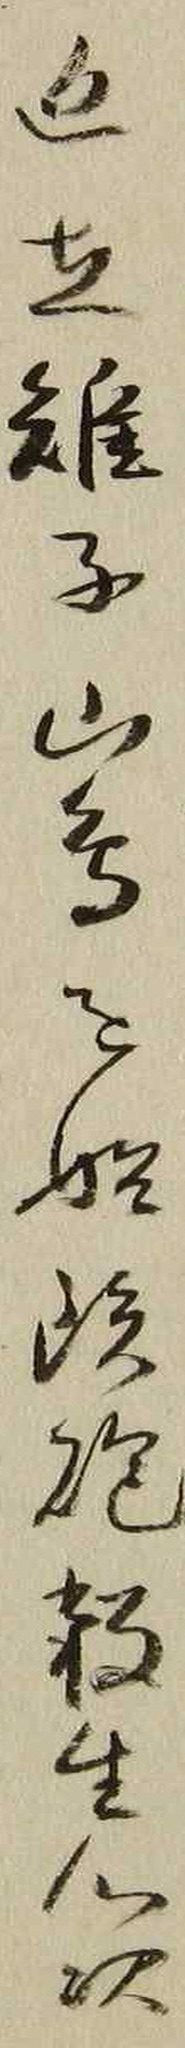辺在雉子山鳥を始鉄砲殺生心次
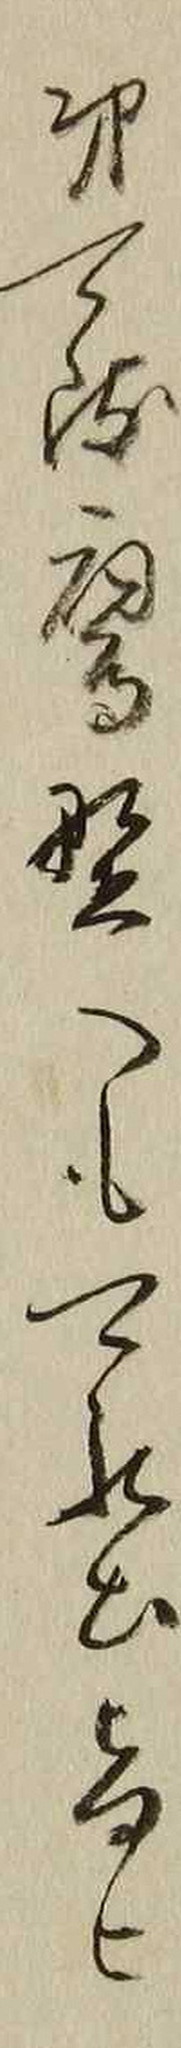第可致鷹野へも可罷出旨被
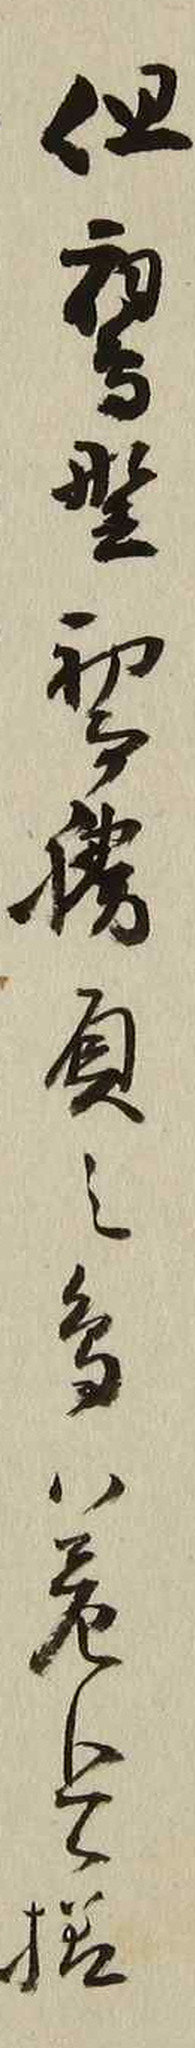但鷹野初而勝負之鳥は差上候様
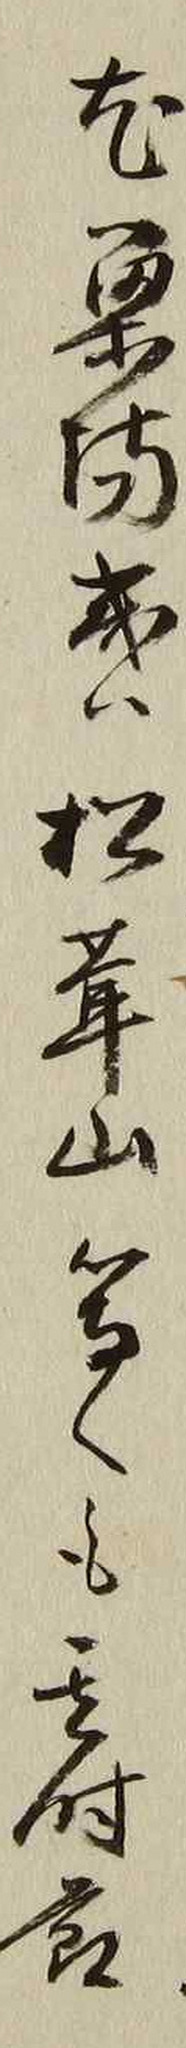尤巣備義は松茸山等へも其時節
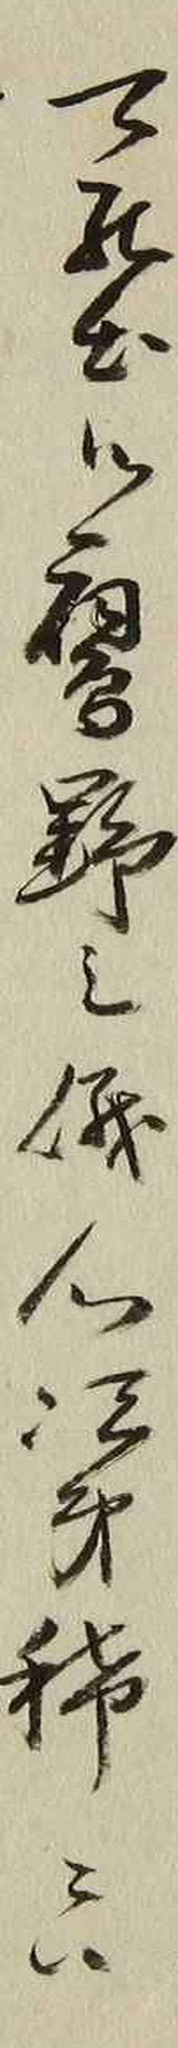可罷出御鷹野之儀心次第稀には
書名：諸士系譜　巻之292　き之部1
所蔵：会津若松市立会津図書館
